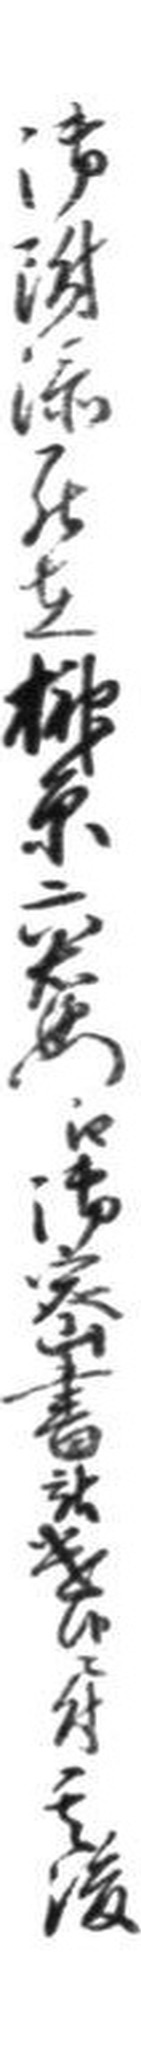御附添罷在榊原六右衛門江御密書被遣候ニ付其後
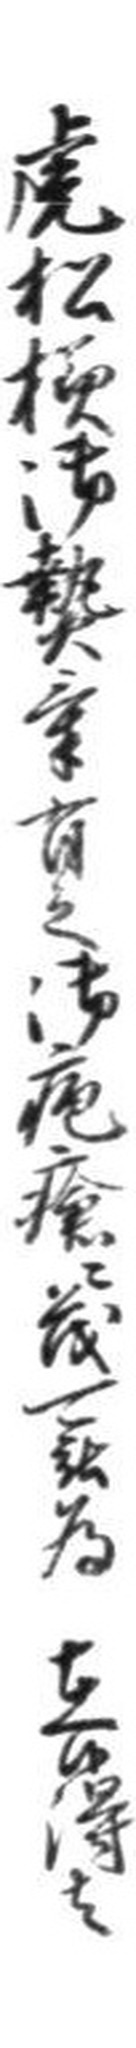虎松様御熱気有之御疱瘡ニも可被為在候得者
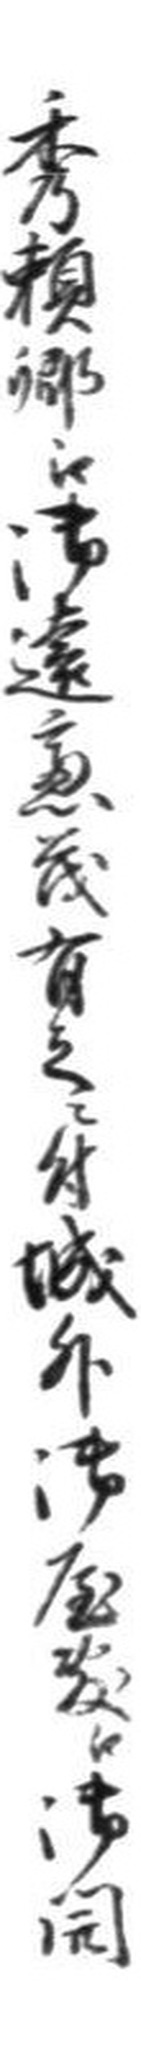秀頼卿江御遠慮も有之ニ付城外御屋敷江御開
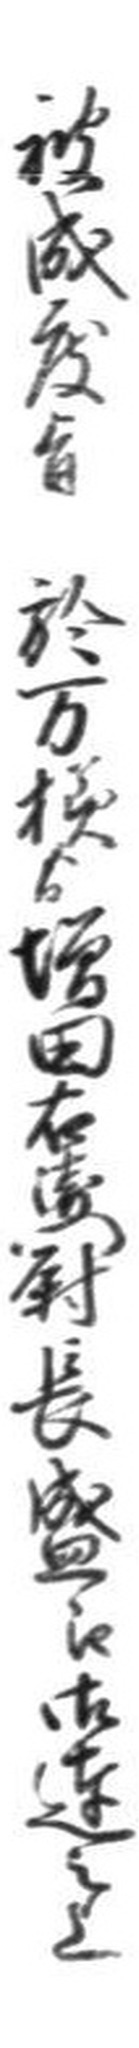被成度旨於万様ゟ増田右衛門尉長盛江御達之上
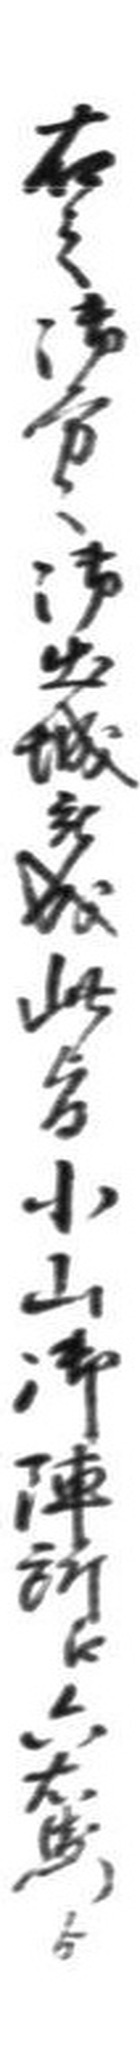右之御方々御出城被成此旨小山御陣所江六右衛門ゟ
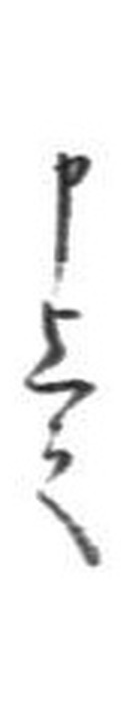申上之
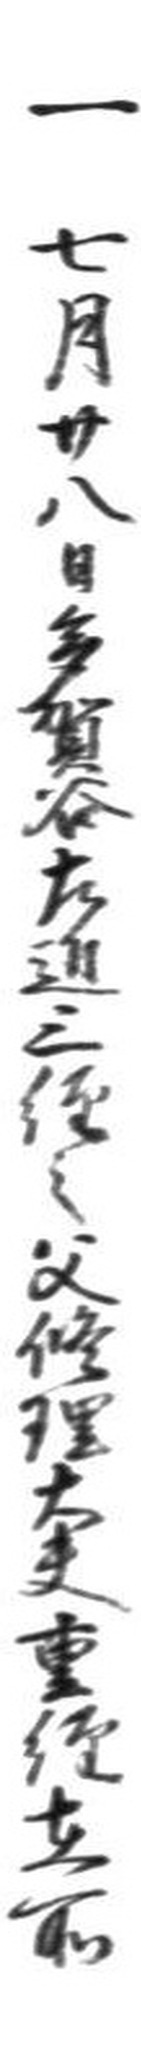一七月廿八日多賀谷左近三経之父修理大夫重経在所
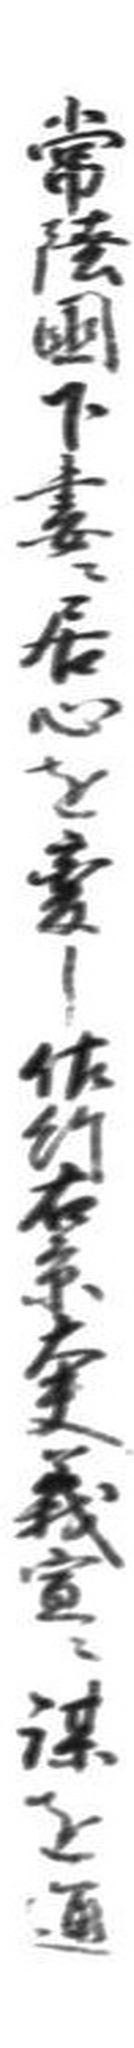常陸国下妻ニ居心を変し佐竹右京大夫義宣ニ謀を通
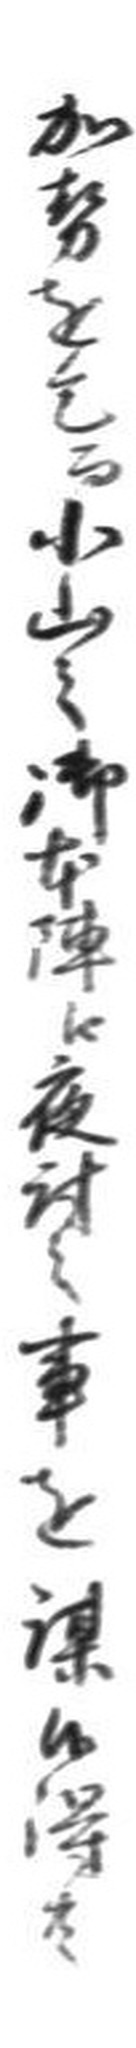加勢を乞而小山之御本陣江夜討之事を謀候得共
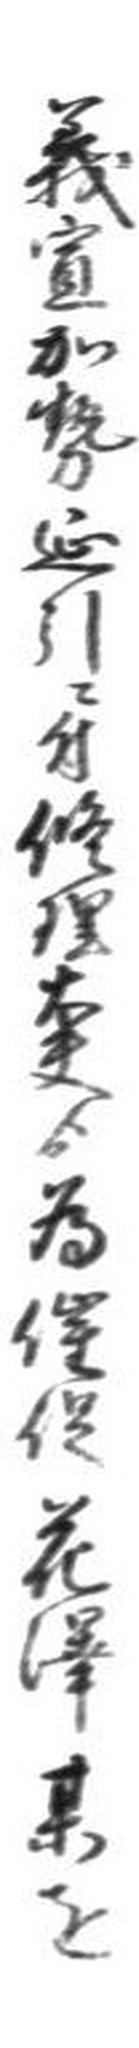義宣加勢延引ニ付修理大夫ゟ為催促花沢某を
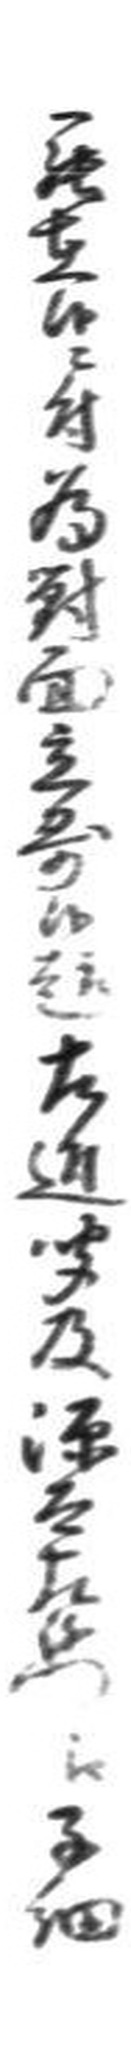罷在候ニ付為対面立寄候趣左近聞及源太左衛門江子細
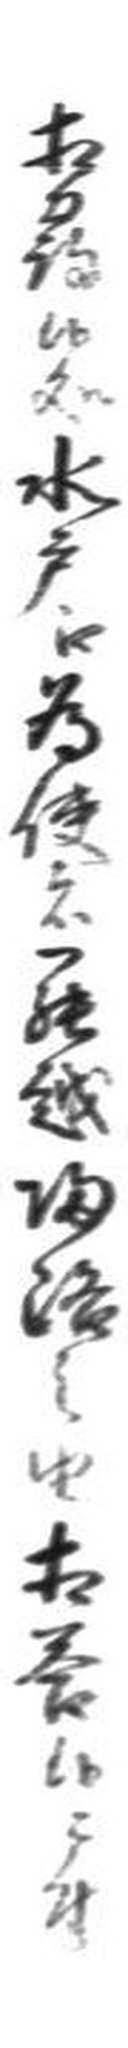相尋候処水戸江為使者罷越帰路之由相答候ニ付

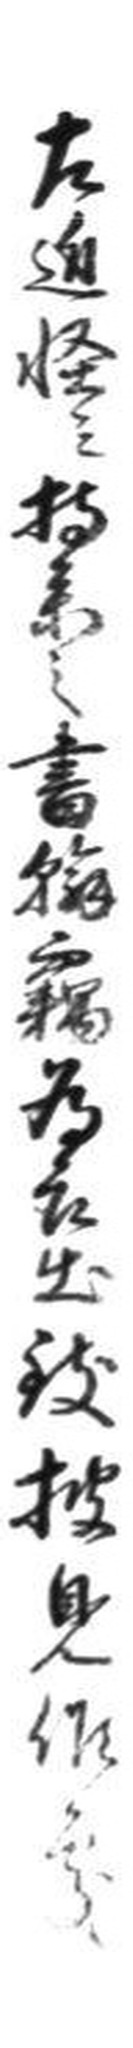左近怪ミ持参之書翰竊為取出致披見候処
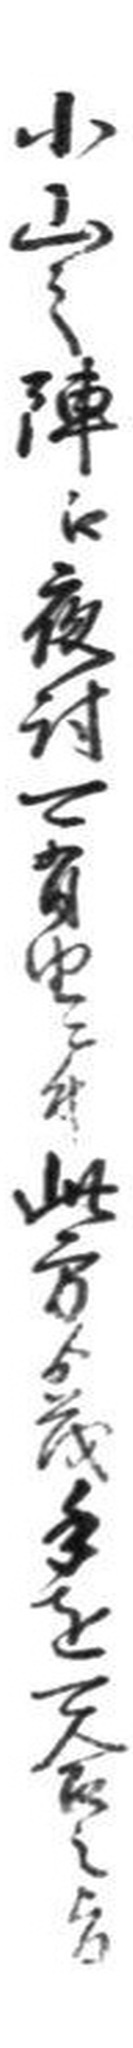小山之陣江夜討可有由ニ付此方ゟも手を可合之旨
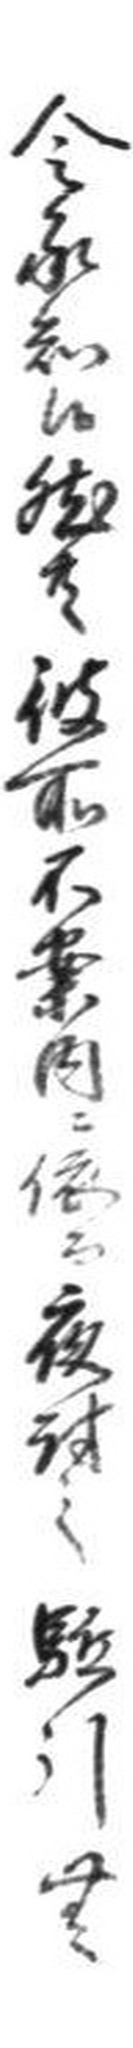令承知候然共彼所不案内ニ依而夜討之駆引無
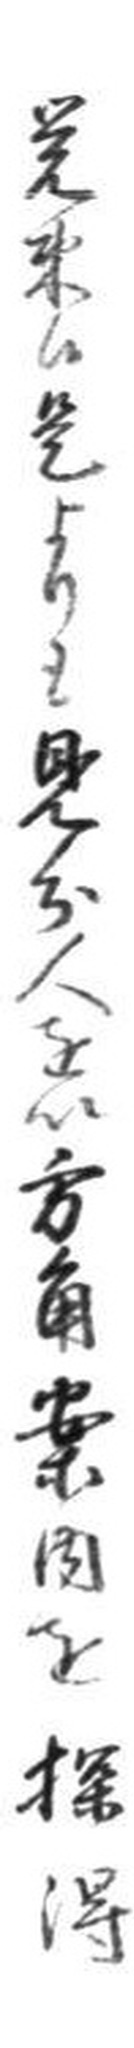覚束候是よりも見分人を以方角案内を探得
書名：家譜 一 秀康公 従天正二年到慶長十二年
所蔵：福井県文書館 Fukui Prefectural Archives
